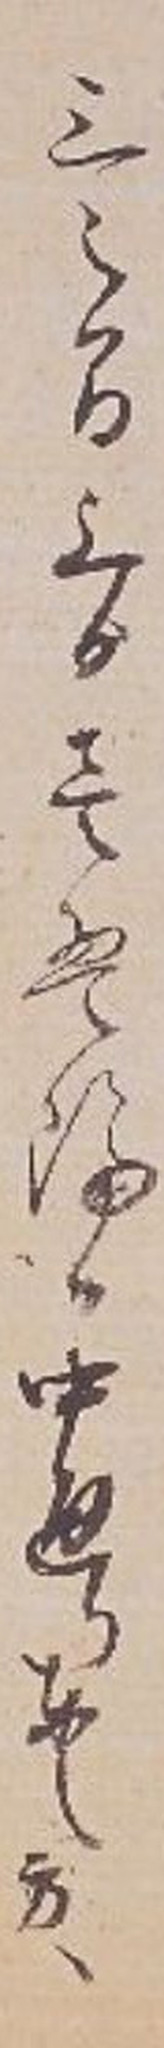三之間上ゟ壱畳隔而中通り東之方へ
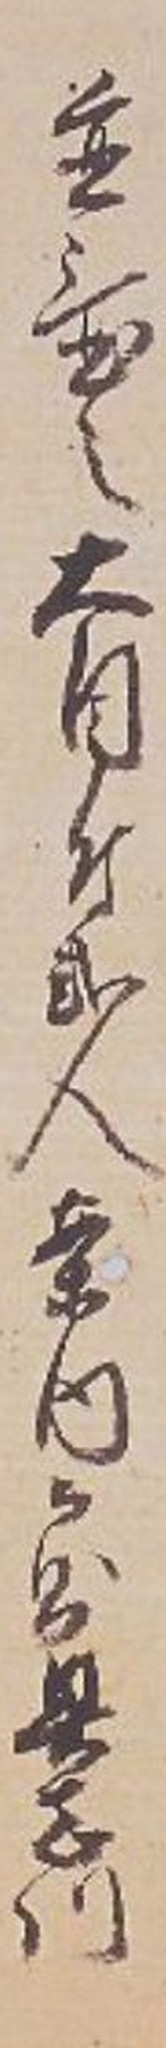並置之大目付弐人案内而則具志川
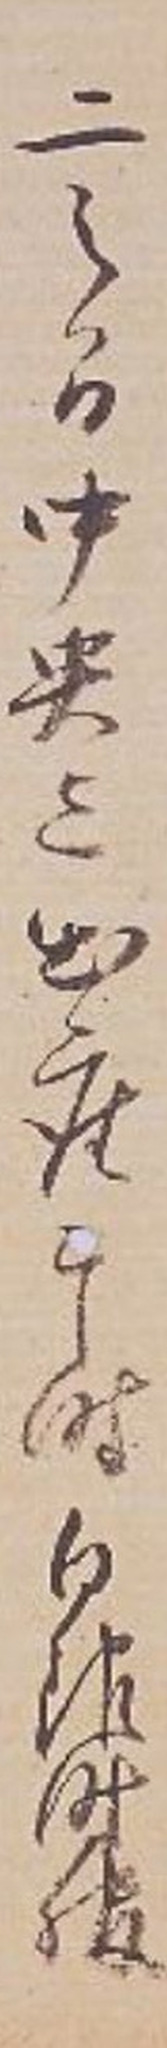二之間中央迄出座于時白銀時服
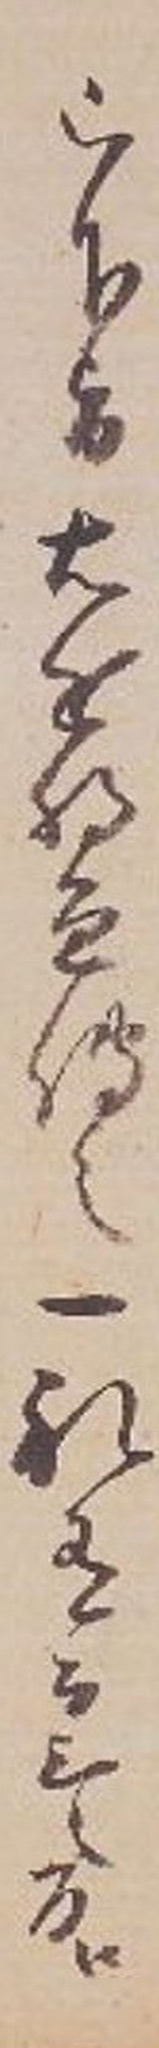被下旨右近将監伝之一礼有三之間え
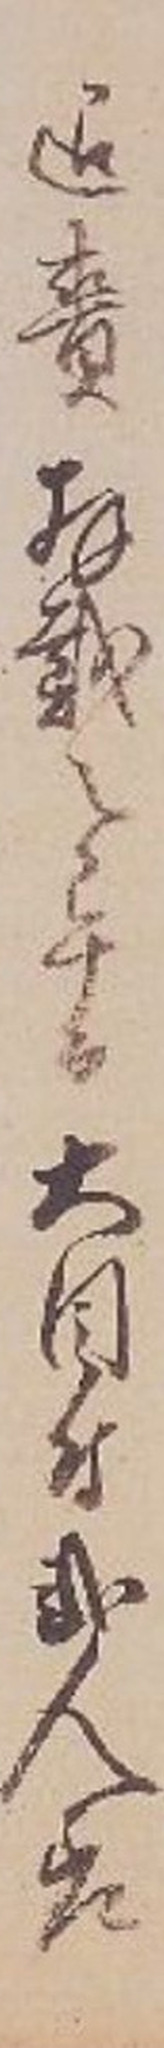退賚物戴之畢而大目付弐人差
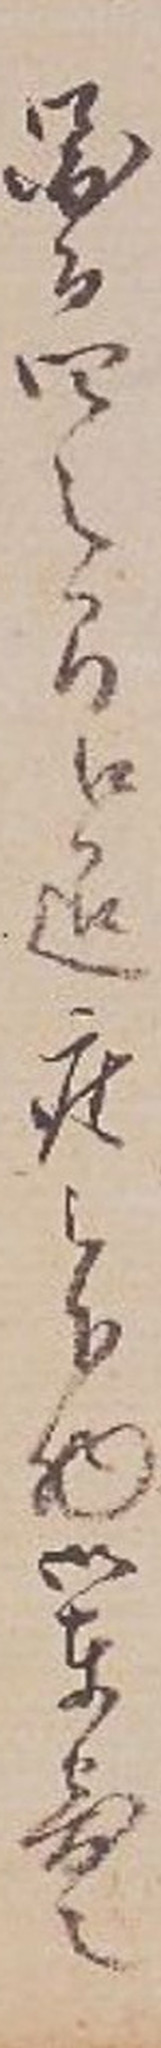図而四之間え退座被下物東寄之
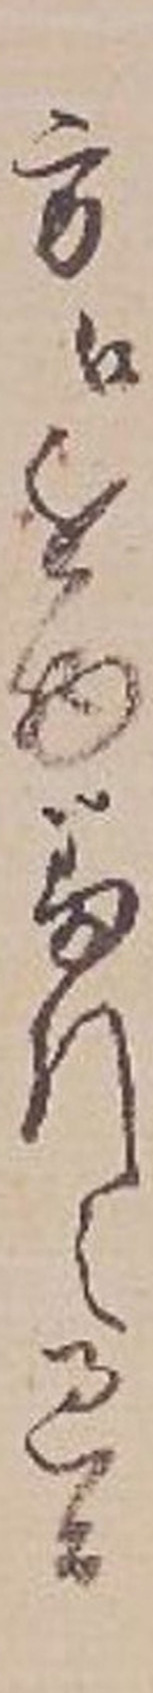方え進物番引之過而
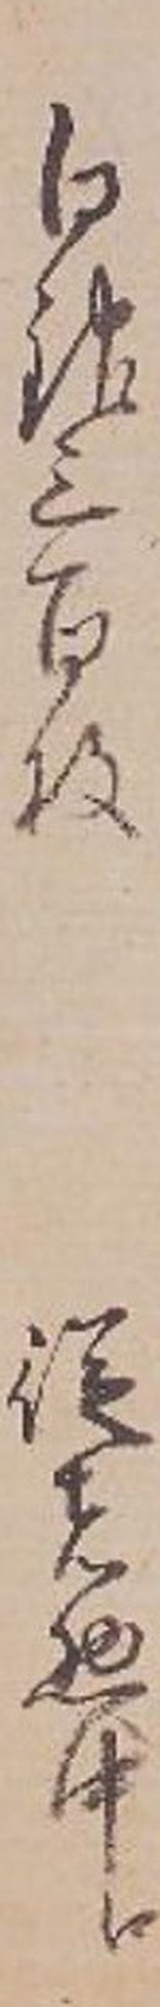白銀三百枚従者惣中え
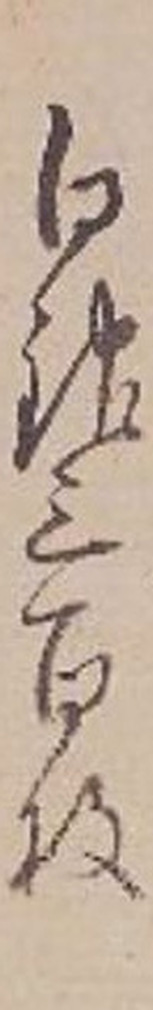白銀弐百枚

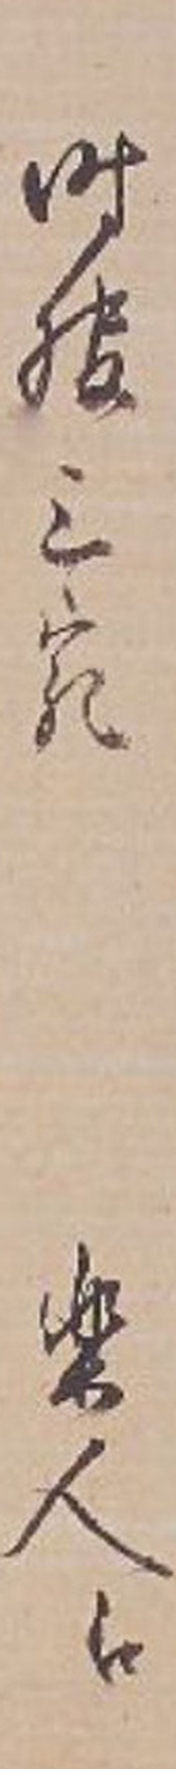時服三宛楽人え
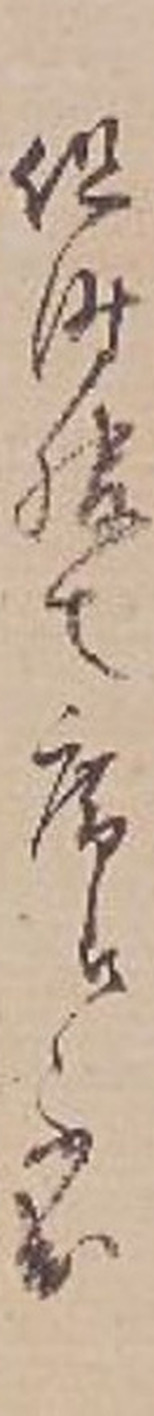但時服は席え不出
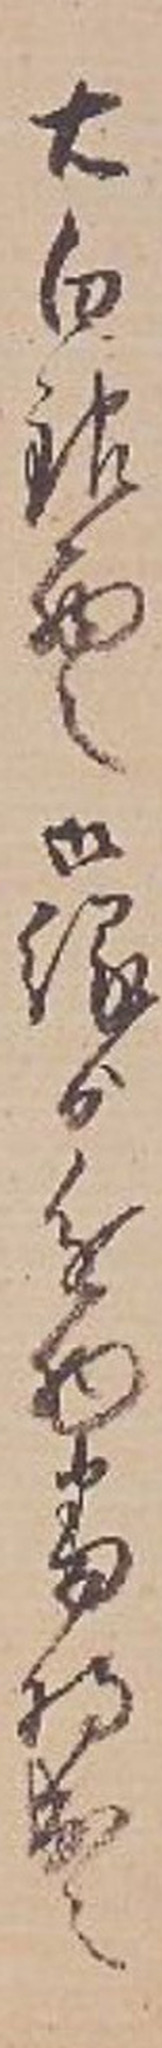右白銀西之御縁ゟ進物番持出之
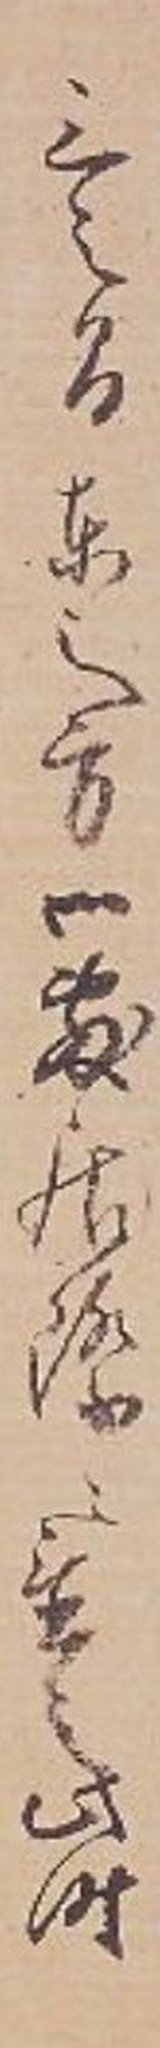三之間東之方御敷居際に置之此時
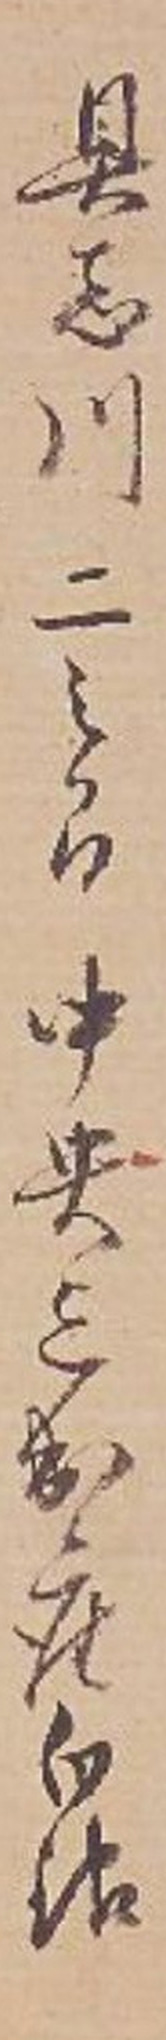具志川二之間中央迄出座白銀
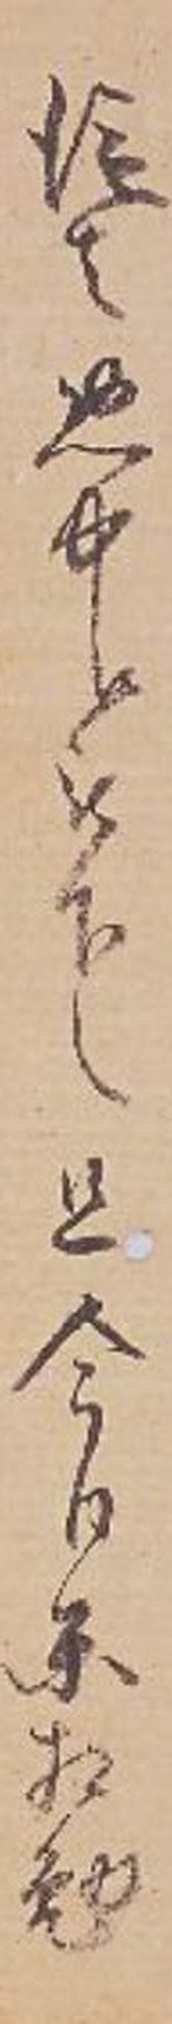従者惣中え被下之且今日楽相勤
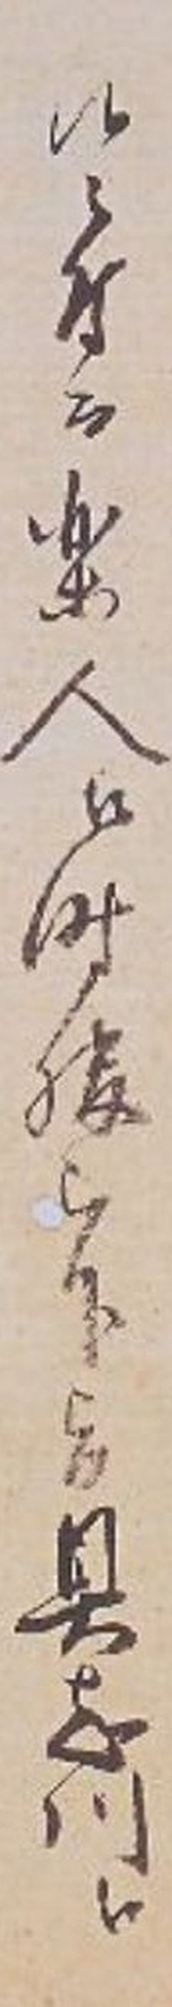候に付而楽人え時服被下旨具志川え
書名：琉球人来朝記 八、九
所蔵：University of the Ryukyus Library
